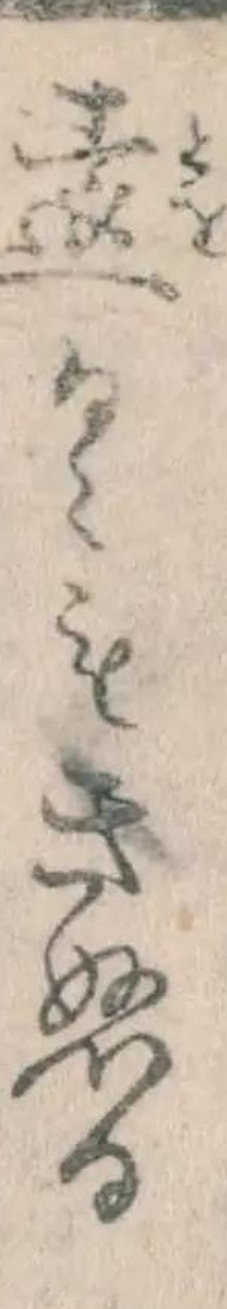遠くもきぬる
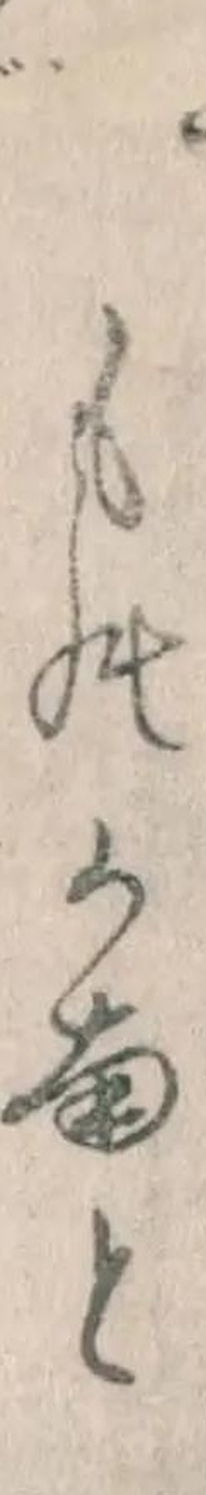ものかなと
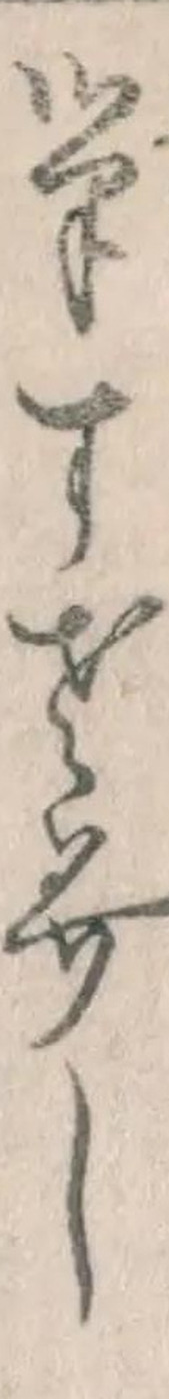筆すさみし
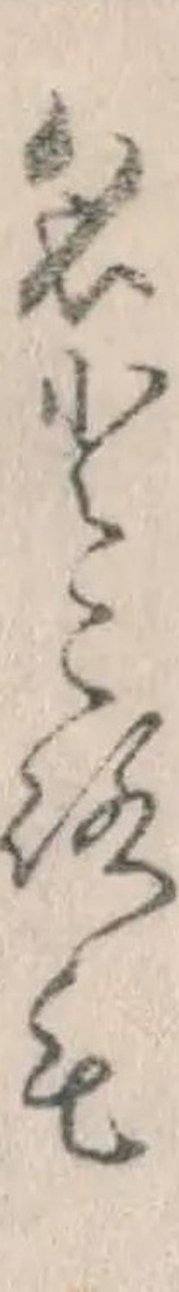名ところも
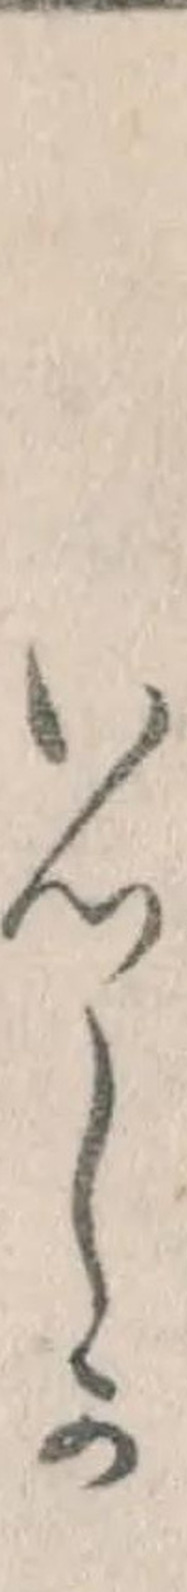いつしか
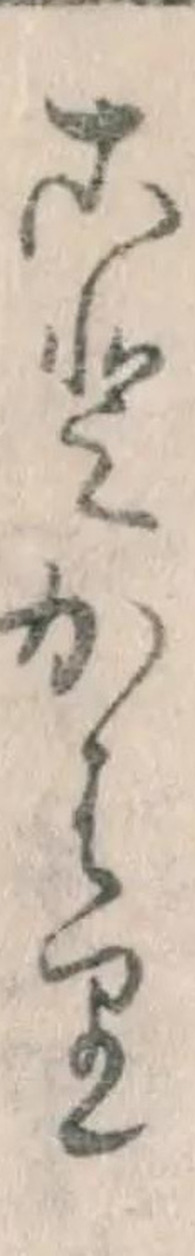ことかはり
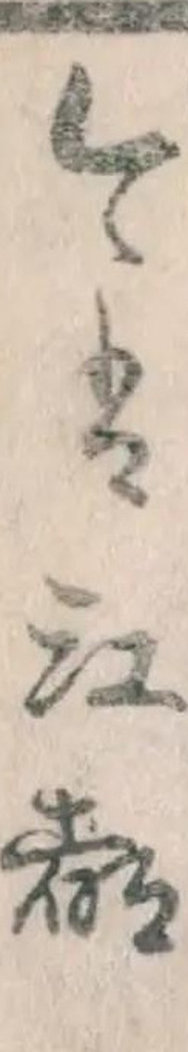今は江都
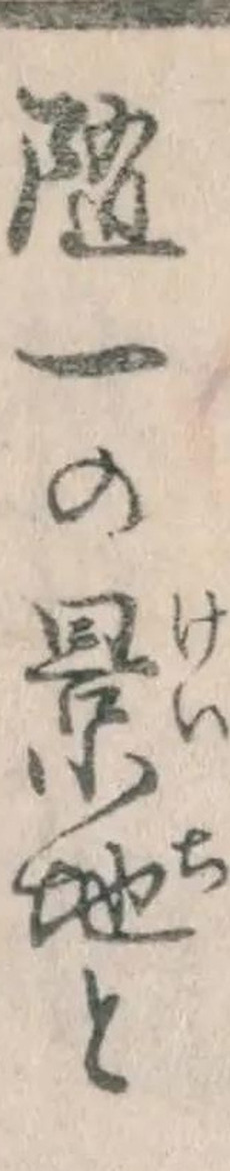随一の景地と
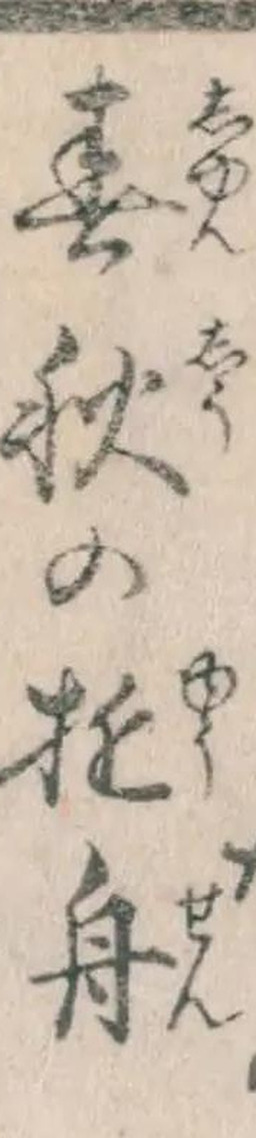春秋の遊舟
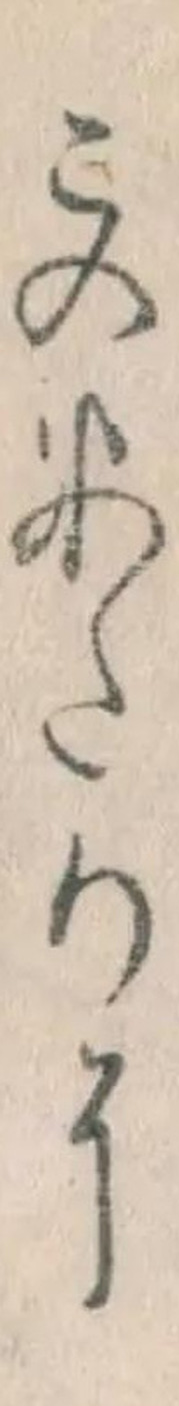このわたりに
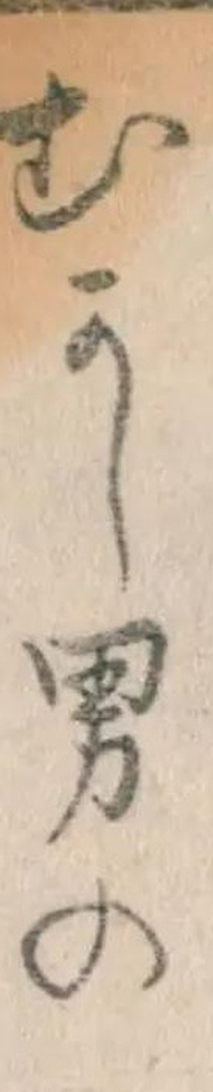むかし男の
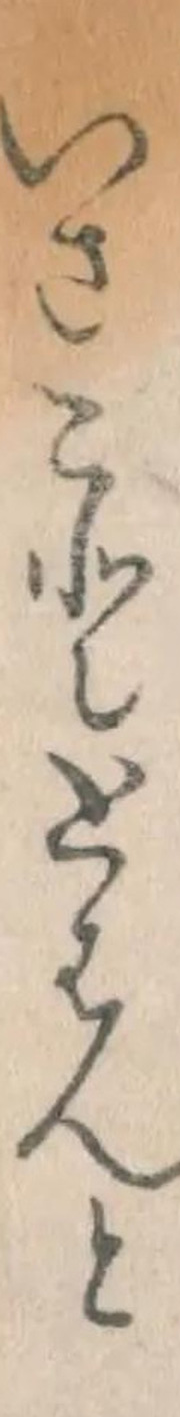いさこととはんと
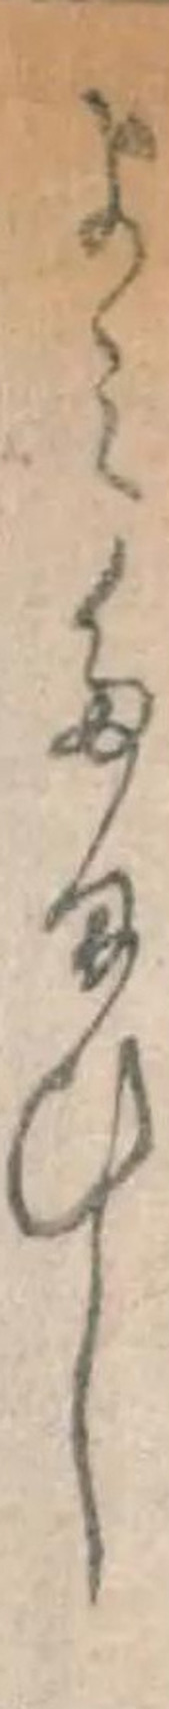よみたまひし
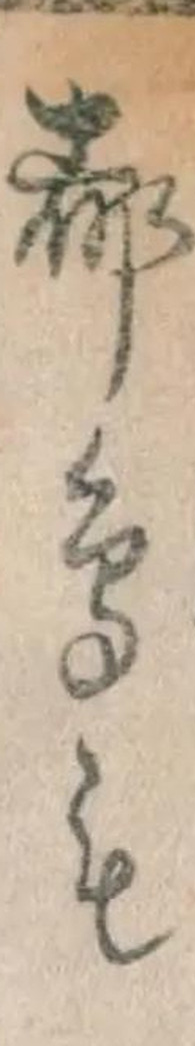都鳥も
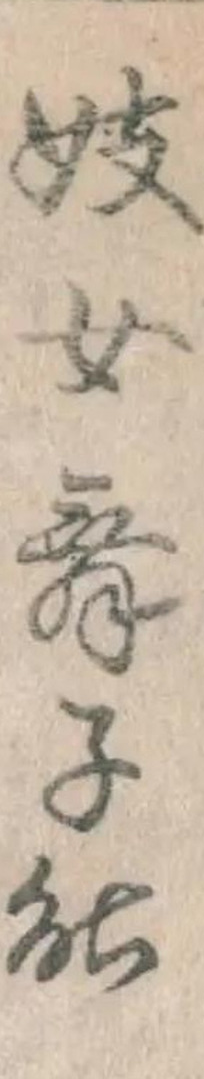妓女舞子の
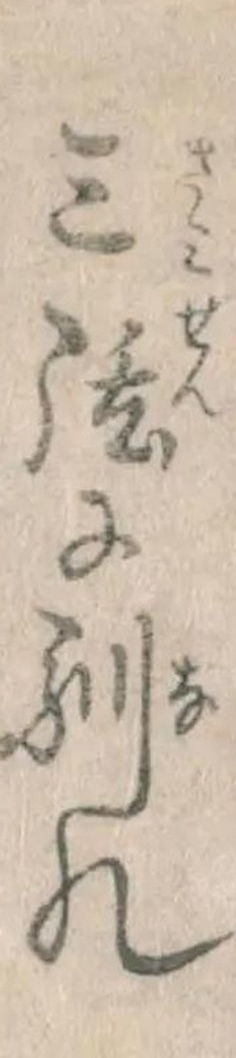三弦に馴れ
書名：絵本物見岡
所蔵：国立国会図書館 National Diet Library, JAPAN
